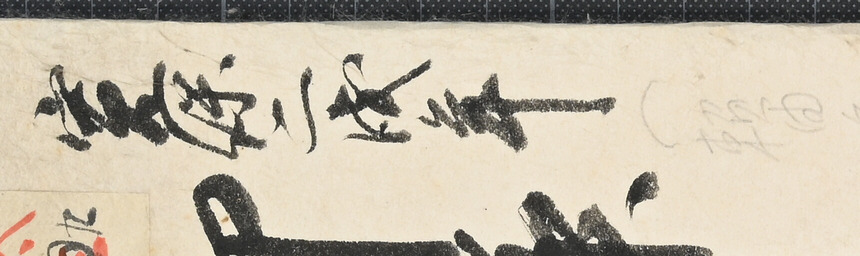寛保二戌年
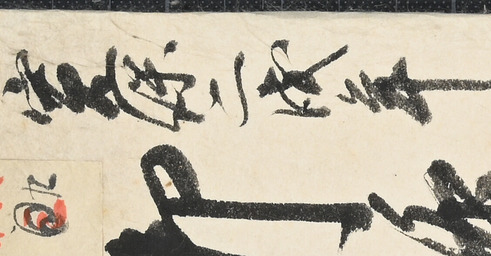寛保二戌年
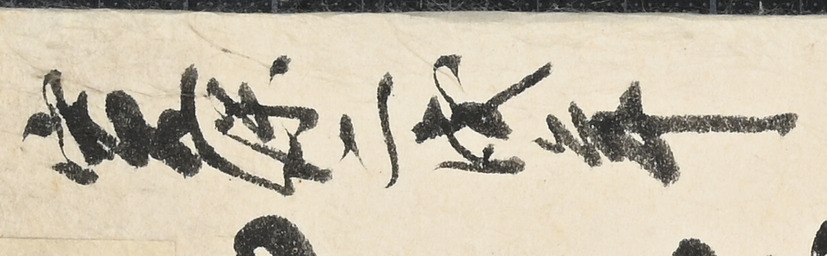寛保二戌年
